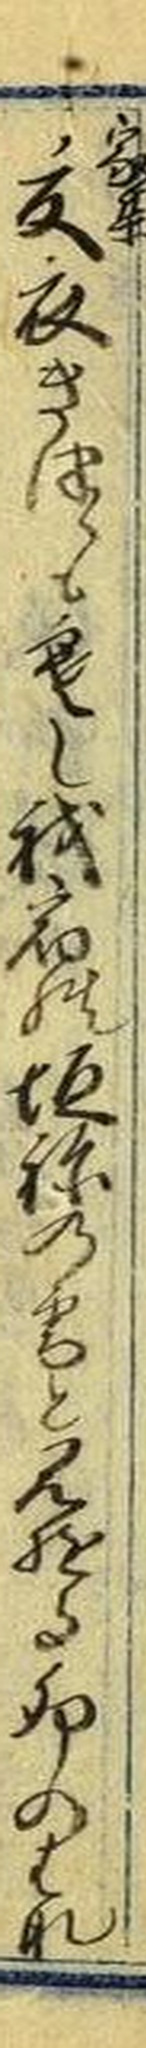夏衣きつゝも寒し我宿の垣ねの雪と見ゆる卯のはな
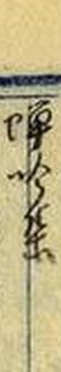蟬吟集
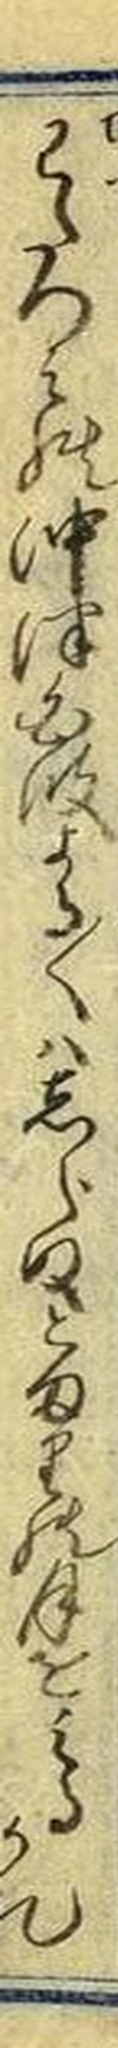わたつみの沖つ白波よる〳〵はしらぬとまりの月をみるかな
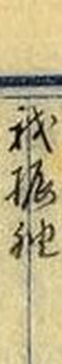我振袖
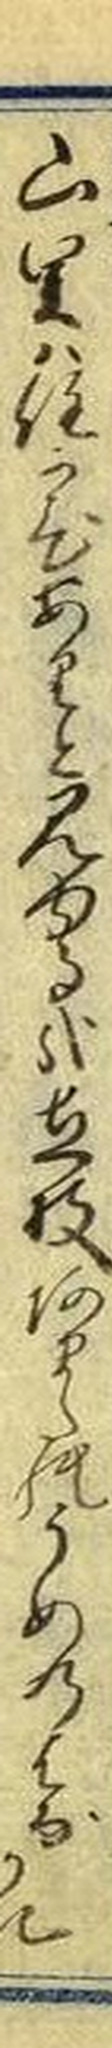山里は住かひありと見ゆる哉支直枝あまたのうめのはなかき
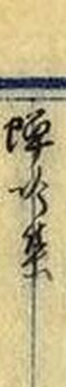蟬吟集
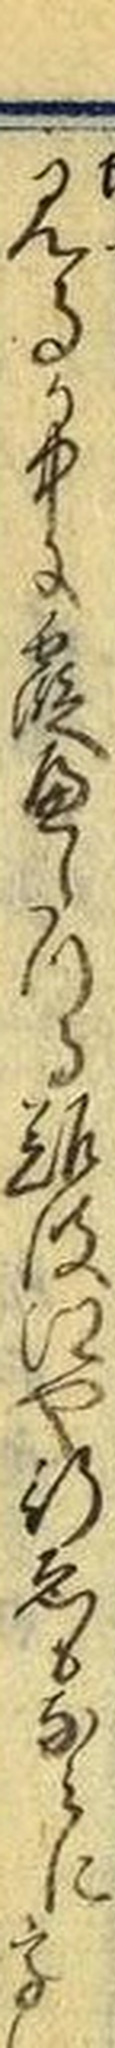見るか中に霞へしつる難波江や行ゑもなみに浮ふ舟人

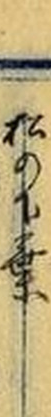松の下葉
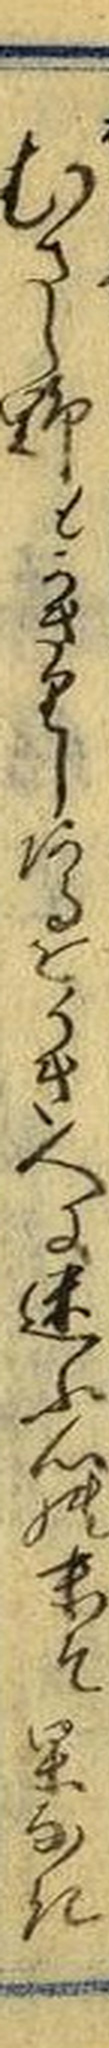むさし野もかきりしあるをうき人に迷ふ心の末そ果なき
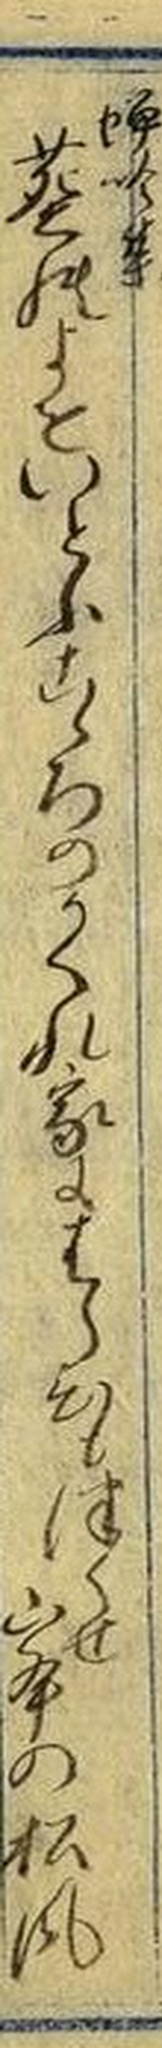葵のよをいとふこゝろのかくれ家にはらひもつくせ峯の松風
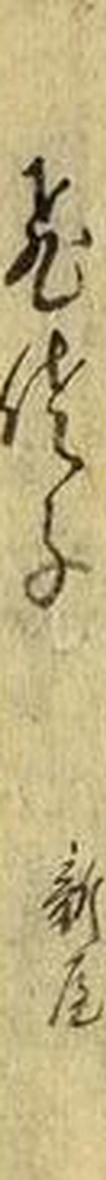ひさ子新屋
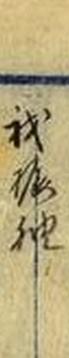我振袖
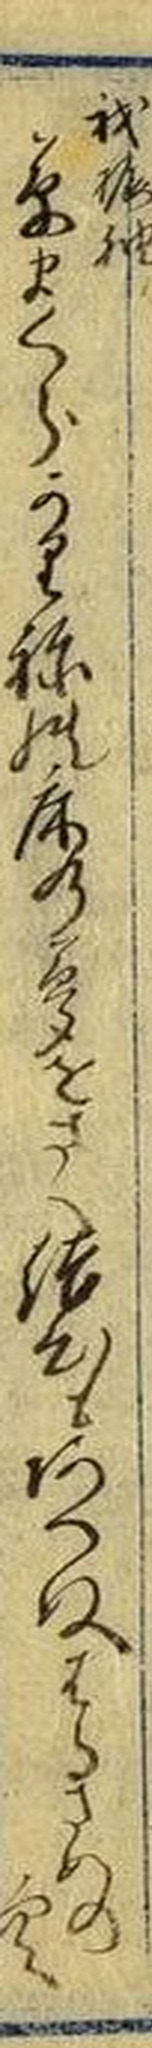草まくらかりねの床の夢をさへ結ひもあへぬはるさめの空
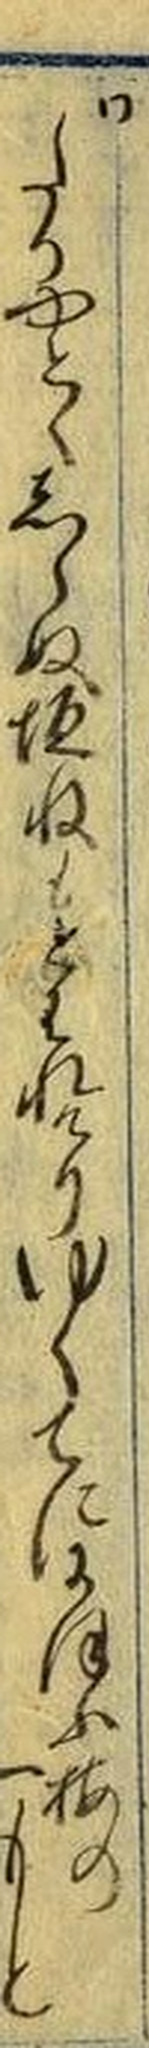たりやとくしらぬ垣ねもとはれけりゆくてににほふ梅の一もと
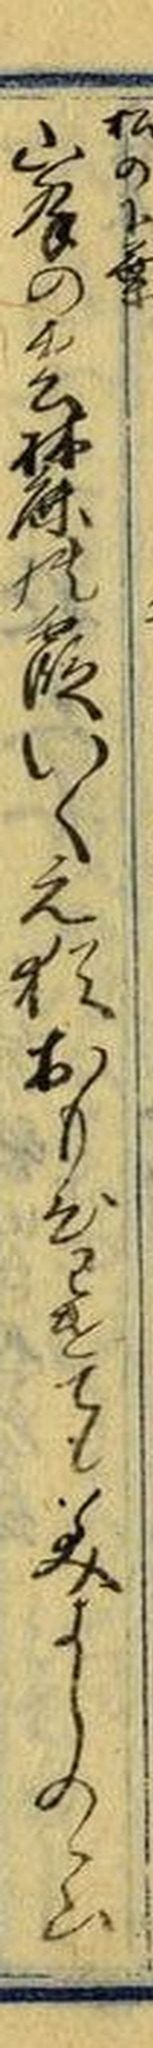山峯の雲麓の霞いくえ猶おもひわけてもみよしのゝ山
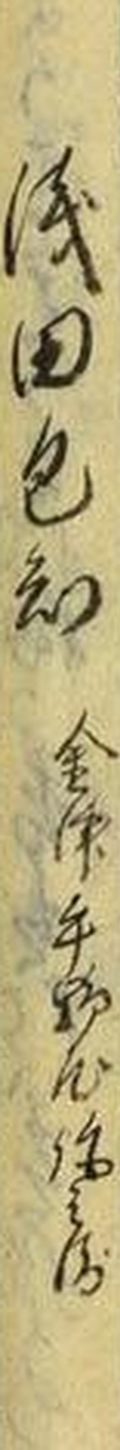浅田包知金津午野屋弥兵衛
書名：温古集 三巻
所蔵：福井県文書館 Fukui Prefectural Archives
